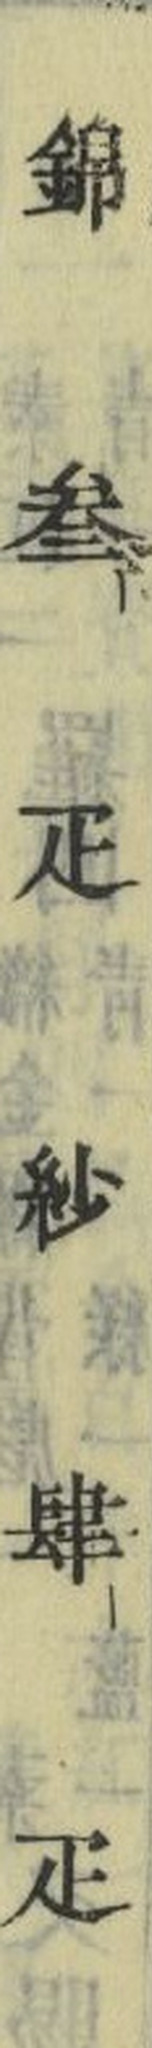錦参-疋紗肆-疋
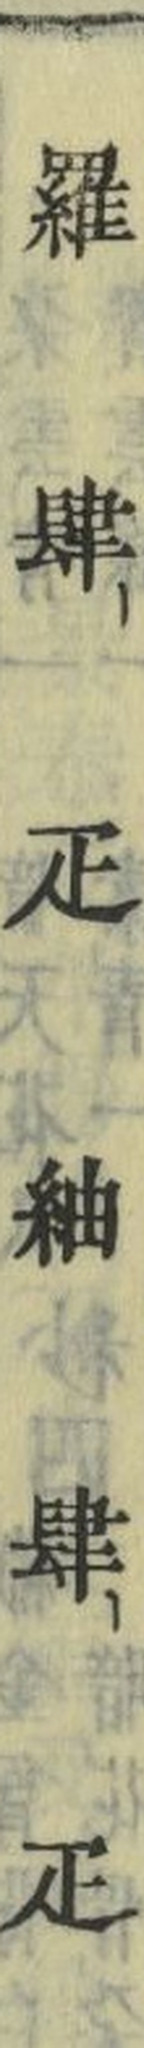羅肆-疋紬肆-疋
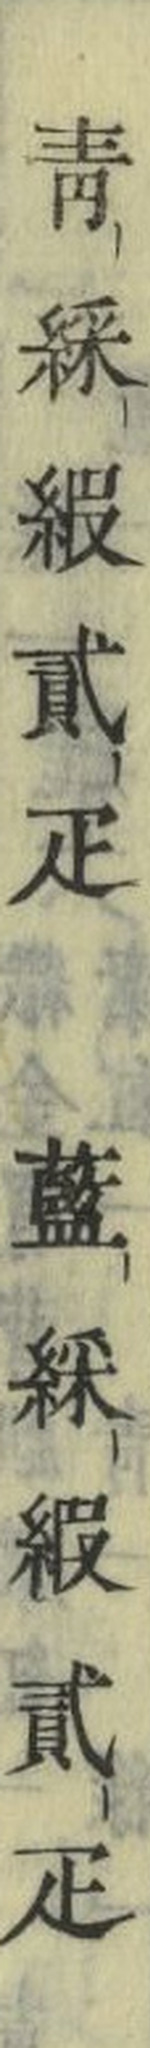青-綵-縀弐-疋藍-綵-縀弐-疋
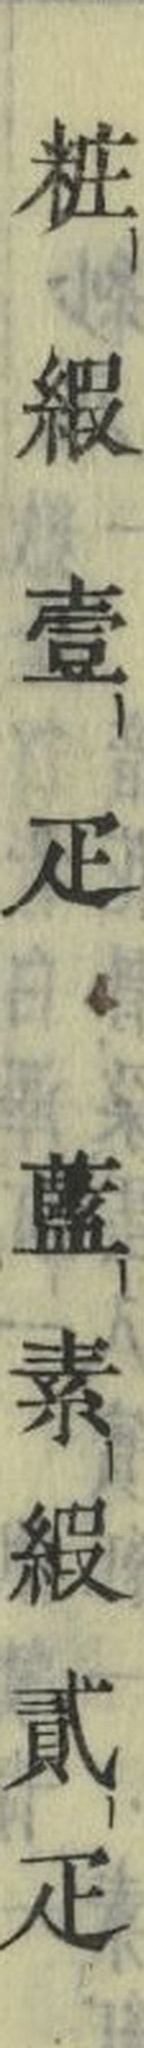粧-縀壱-疋藍-素-縀弐-疋
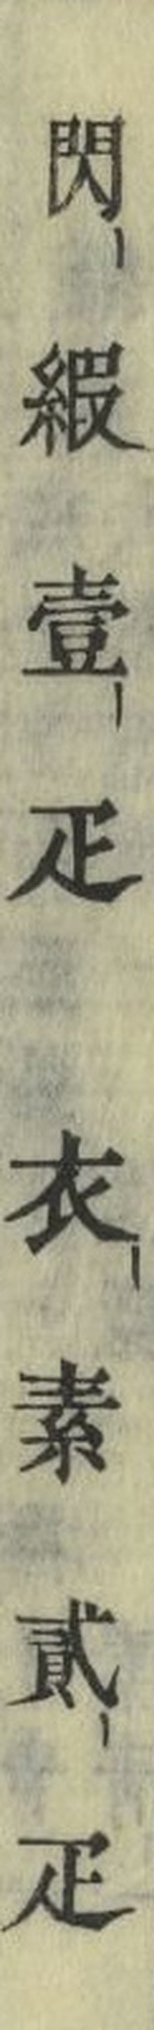閃-縀弐-疋衣-素弐-疋
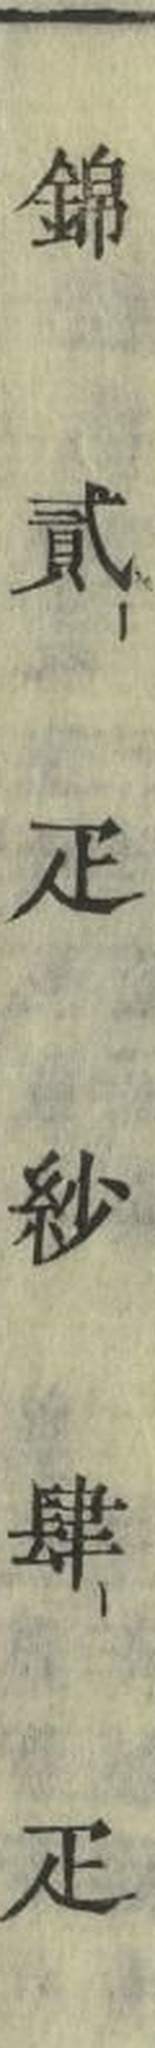錦参-疋紗肆-疋
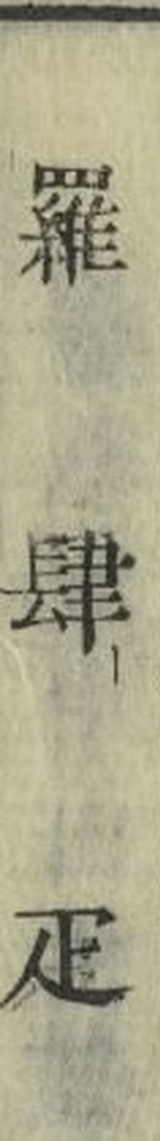羅肆-疋

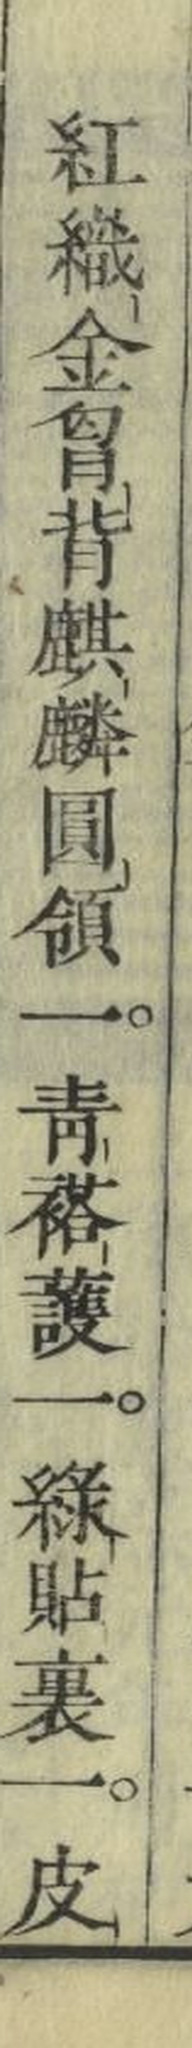紅織-金胸-背麒-麟円-領一。青-褡-護一。緑-貼-裏一。皮-
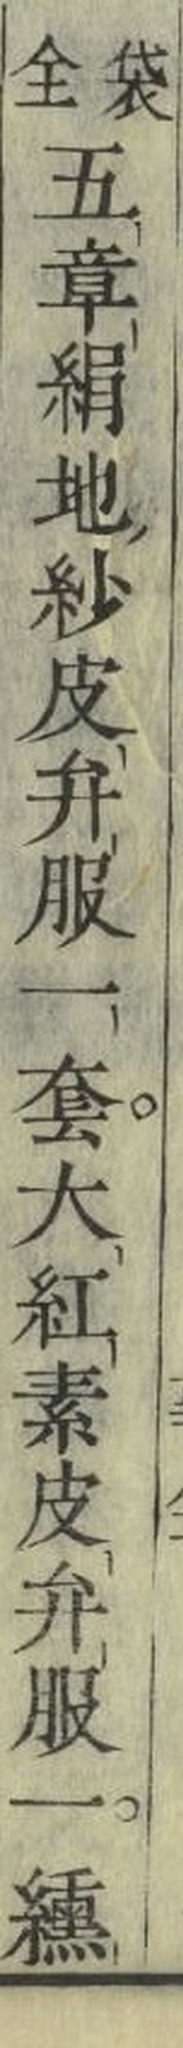袋全五-章-絹地紗皮-弁-服一-套。大-紅-素皮-弁-服一。纁-

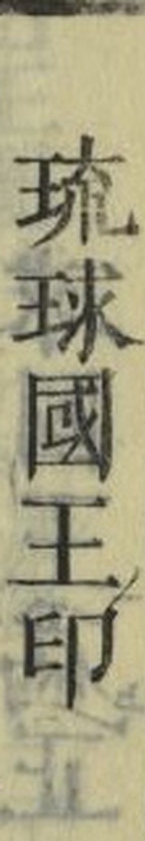琉球国王印
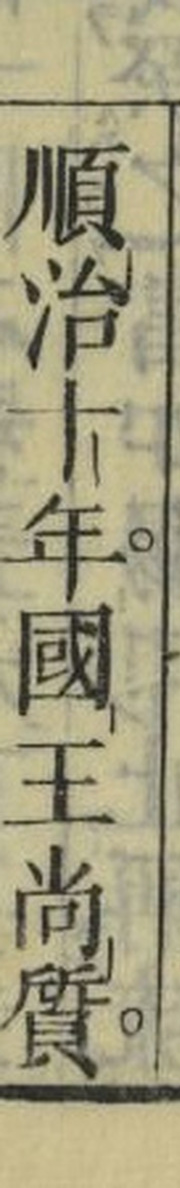順-治十-年。国-王尚-質。
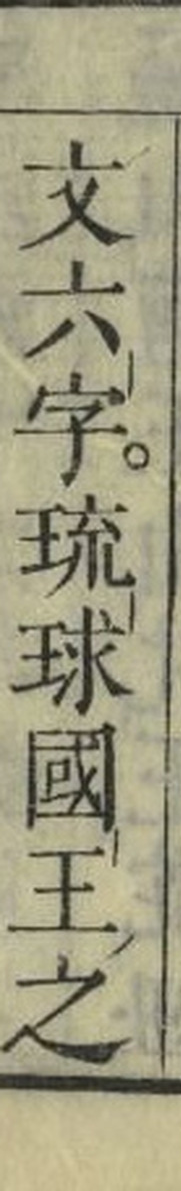文六-字。琉-球国-王之

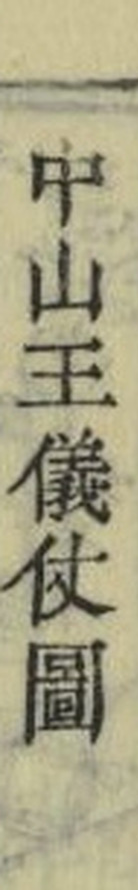中山王儀仗図

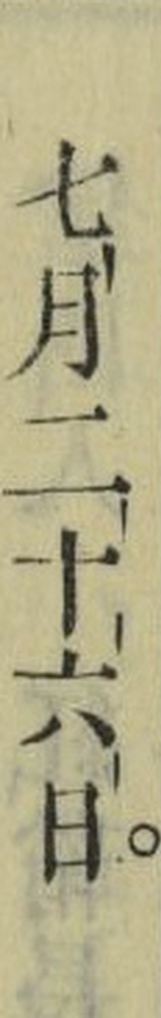七-月二-十-六-日。

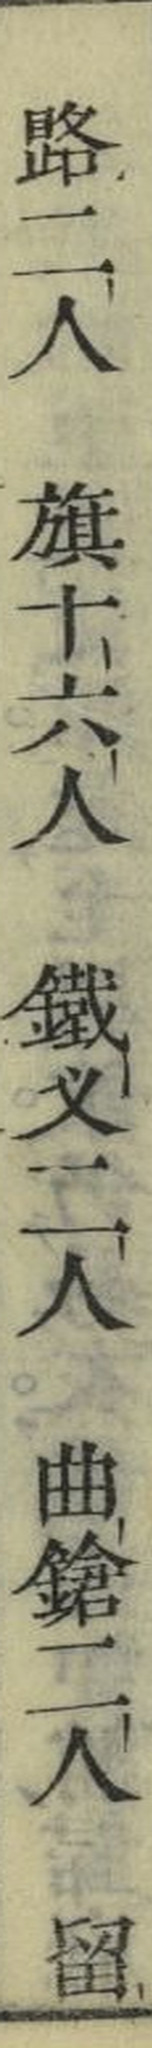路二-人旗十-六-人鉄-义二-人曲-鎗二-人留-
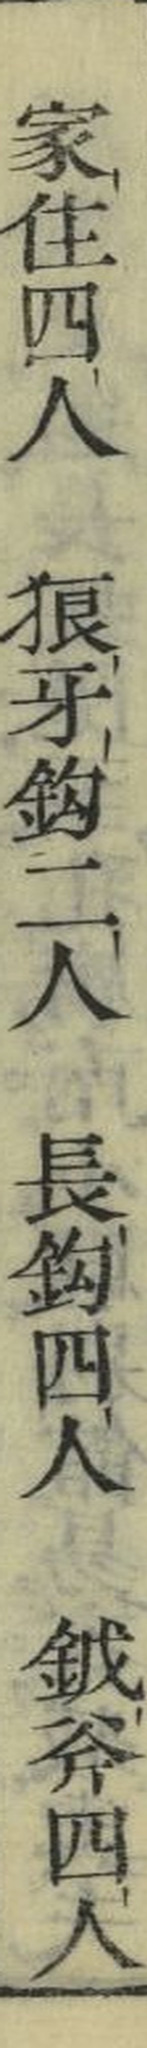家-住四-人狼-牙-鈎二-人長-鈎四-人鉞-斧四-人
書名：中山伝信録 巻二
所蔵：University of the Ryukyus Library
